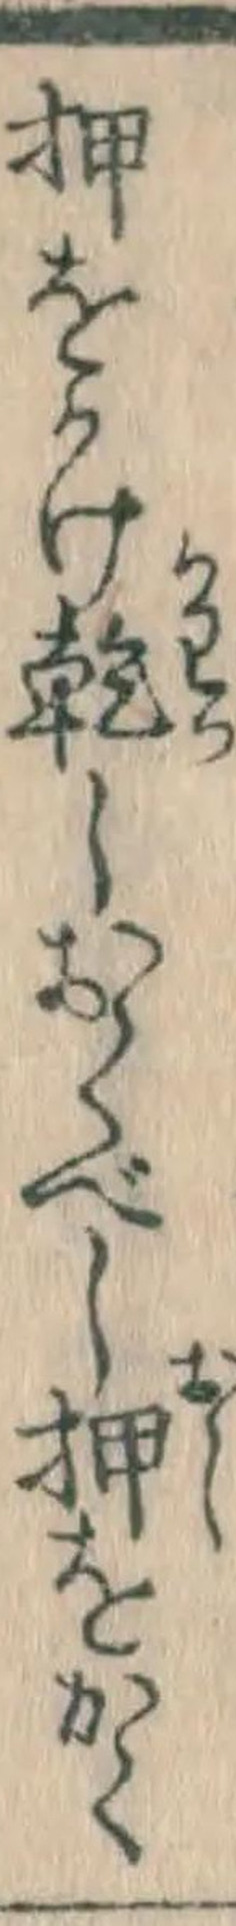押をかけ乾しおくべし押をかく
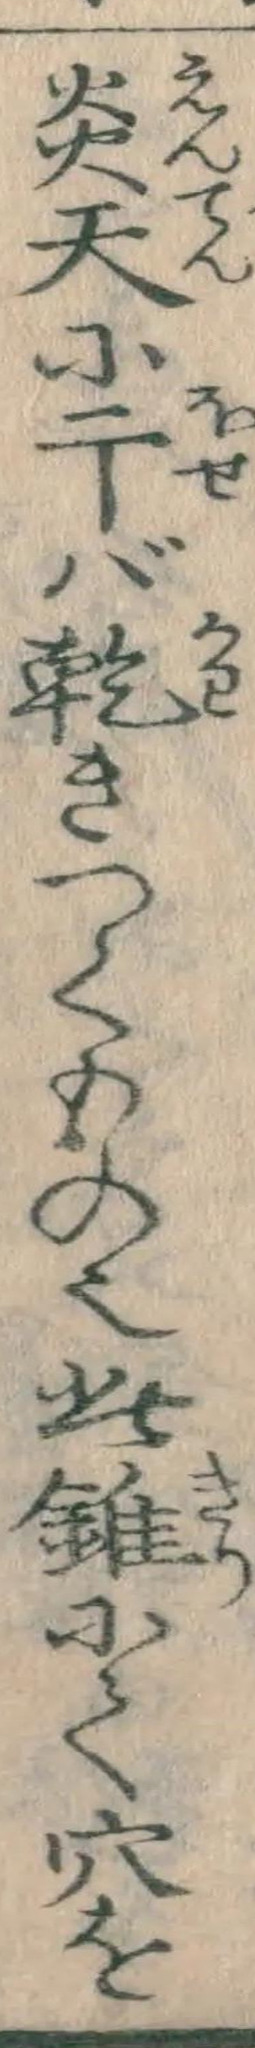炎天に干ば乾きつくもの也此錐にて穴を

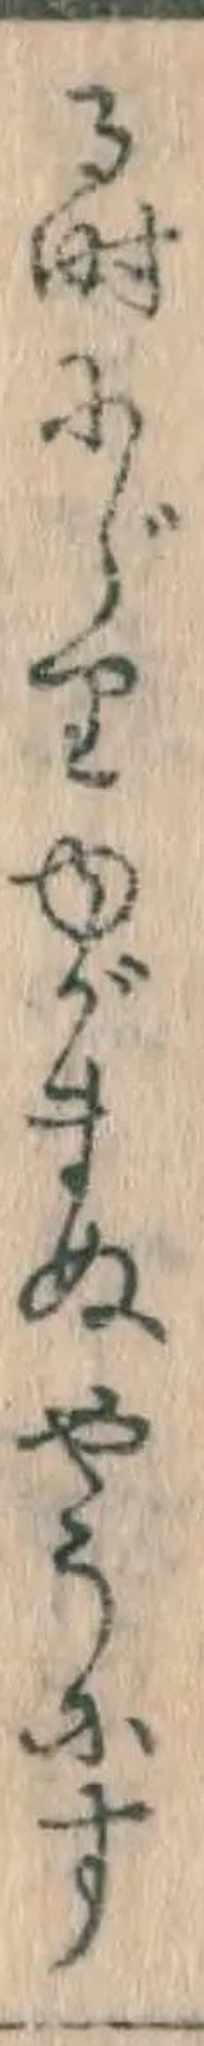る時にじりゆがまぬやうにす
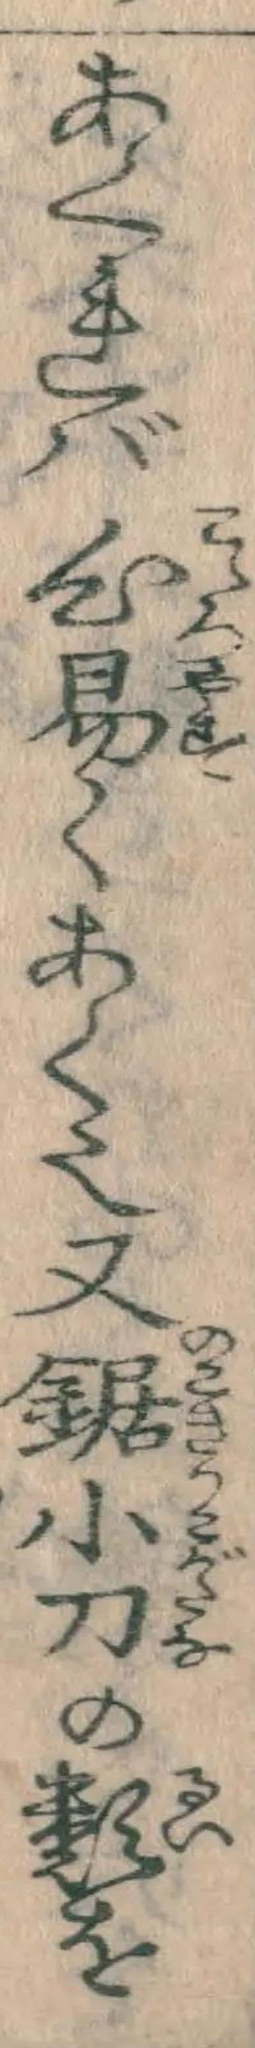あくれば心易くあく也又鋸小刀の類を
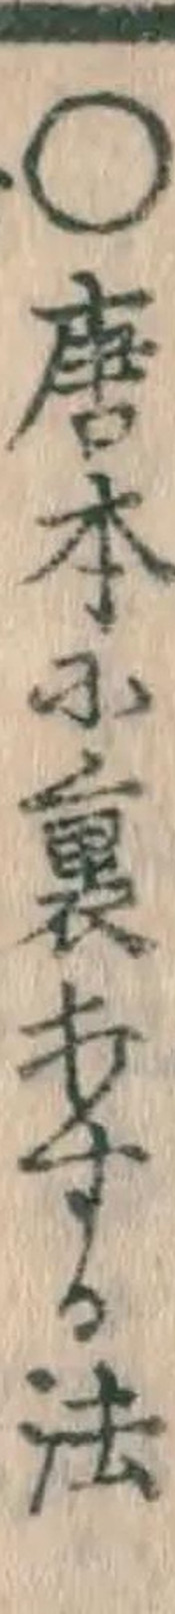○唐本に裏打する法
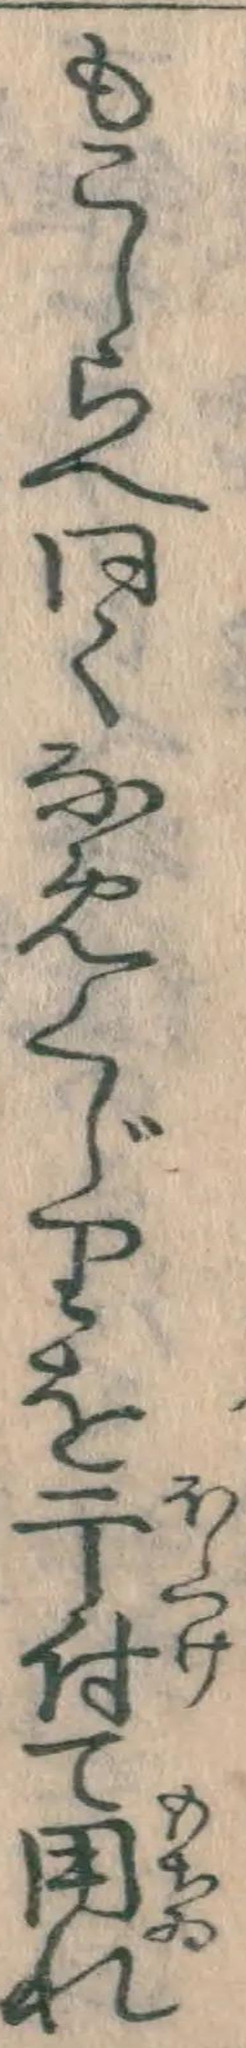もこしらへ同くなめくじりを干付て用れ
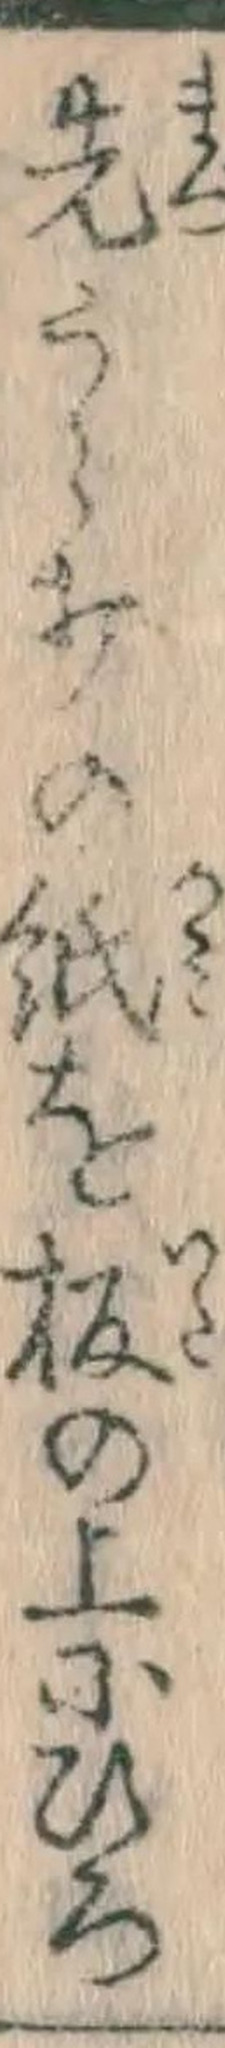先うら打の紙を板の上にひろ
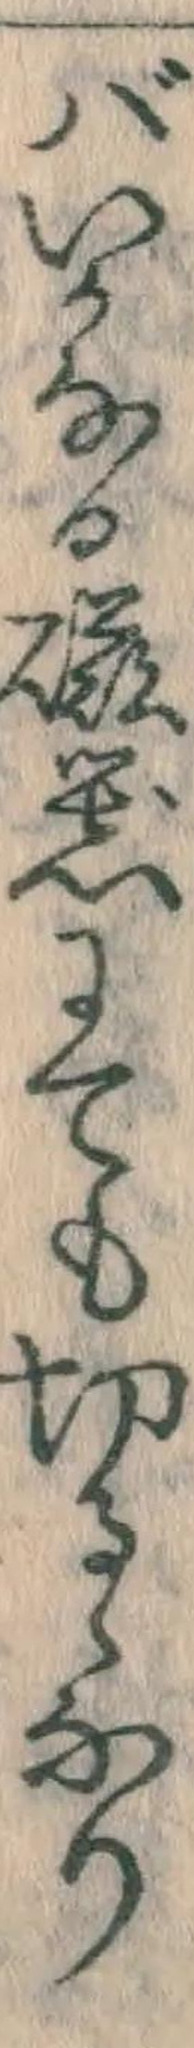ばいかなる磁器にても切るゝなり
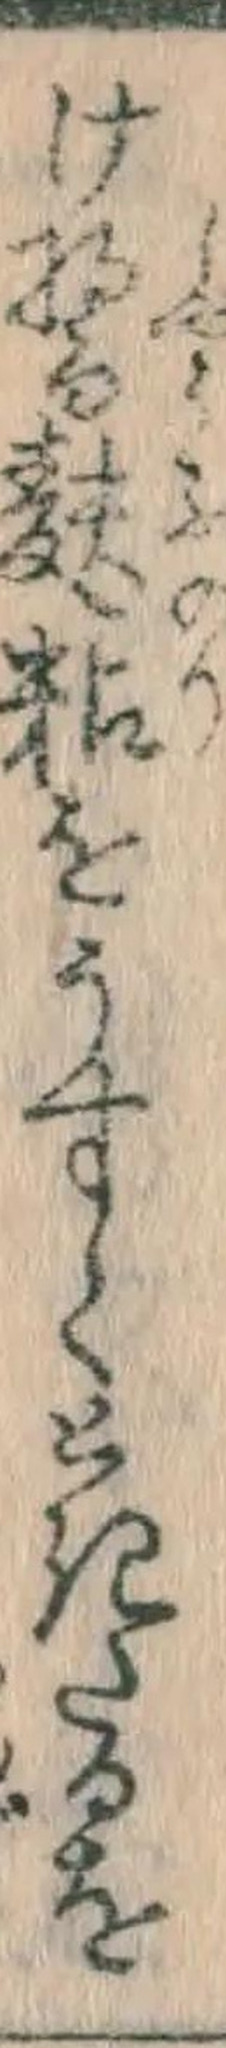け醤麩粘をうすくときたるを
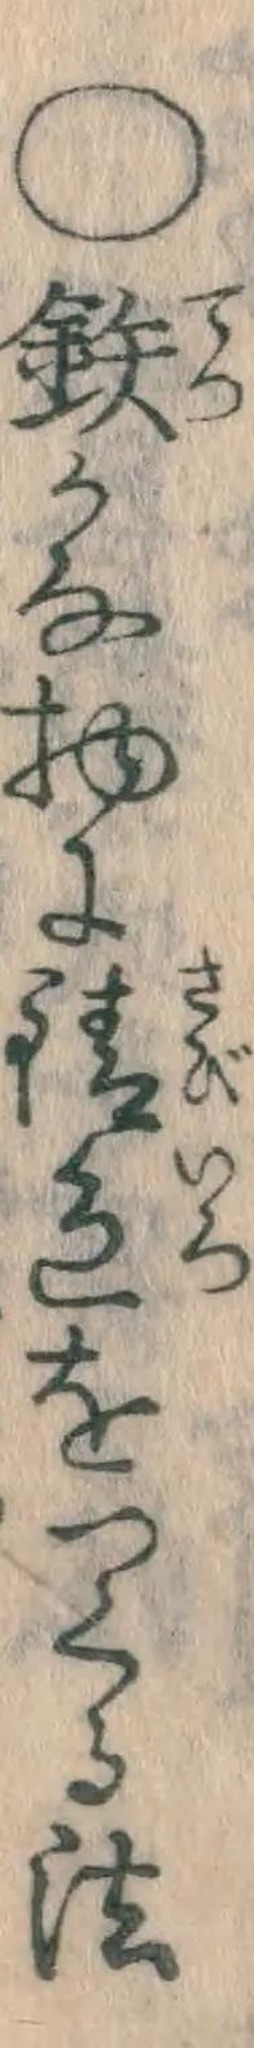○鉄かな物に錆色をつくる法
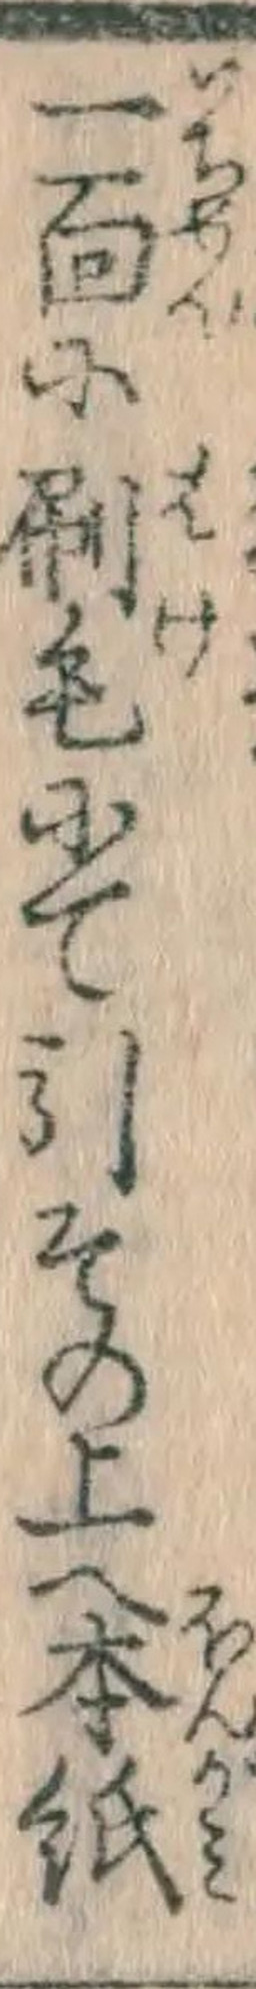一面に刷毛にて引その上へ本紙
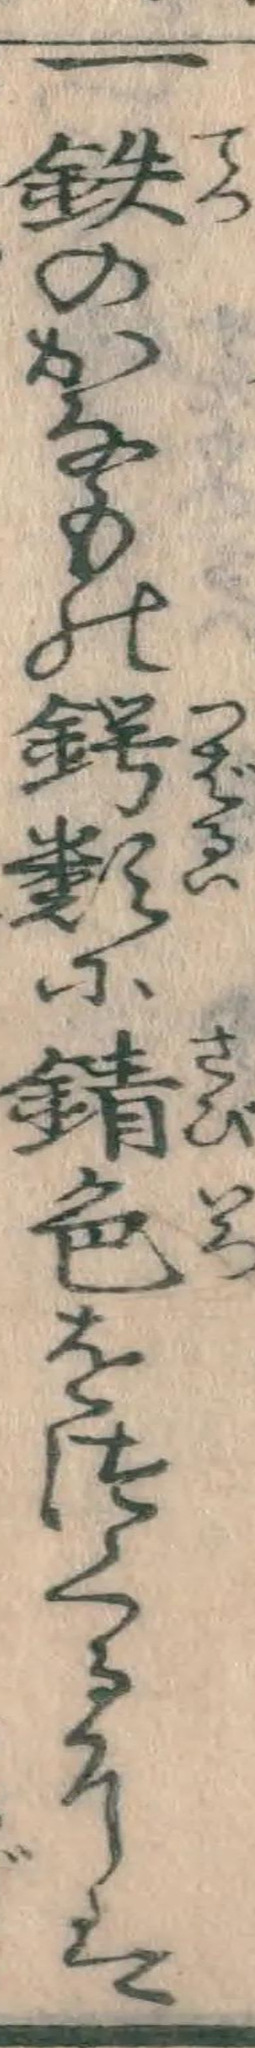一鉄のかなもの鍔類に錆色をつくるには
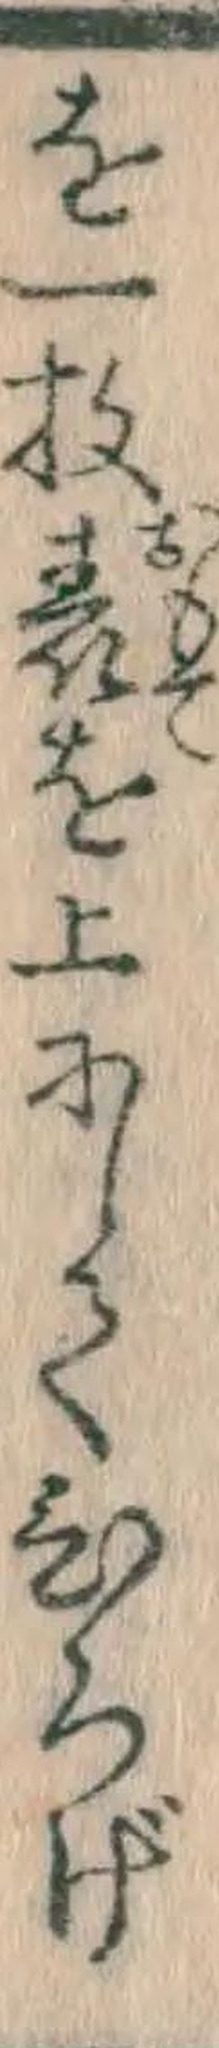を一枚表を上にしてひろげ
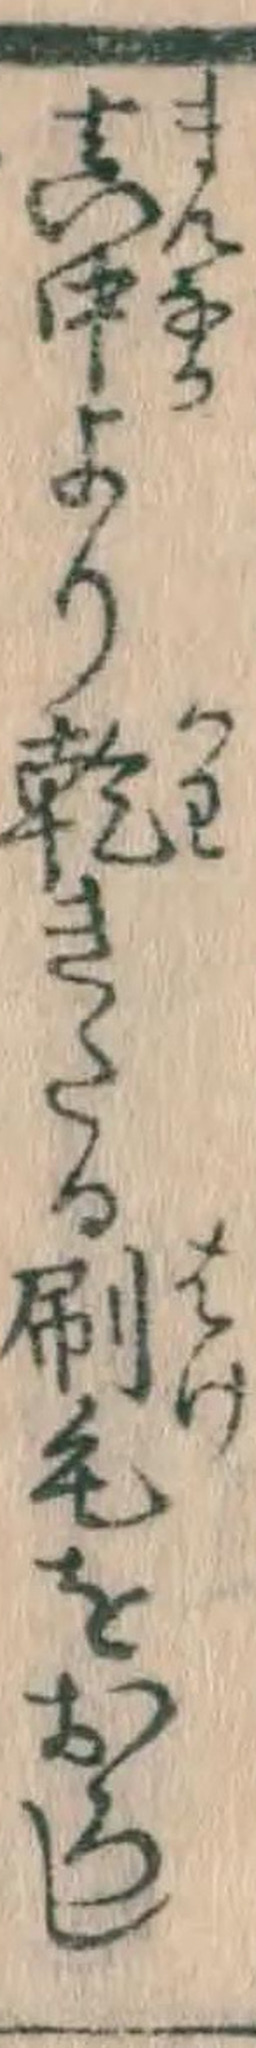真中より乾きたる刷毛をおろし
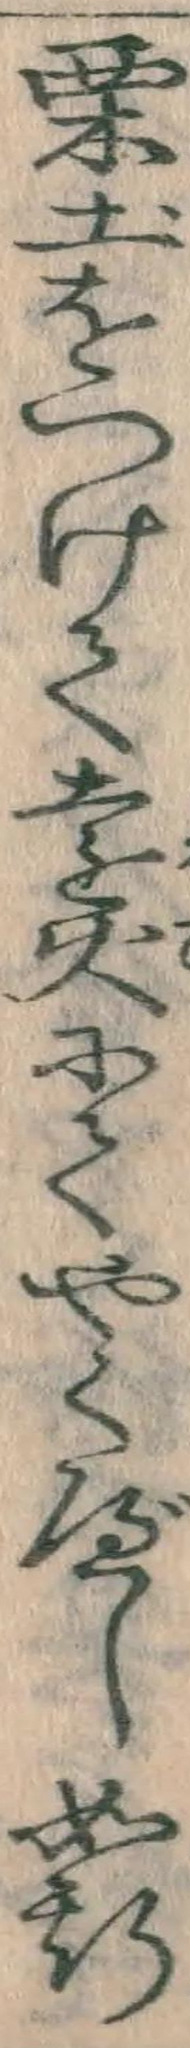栗土をつけて遠火にてやくべし如斯
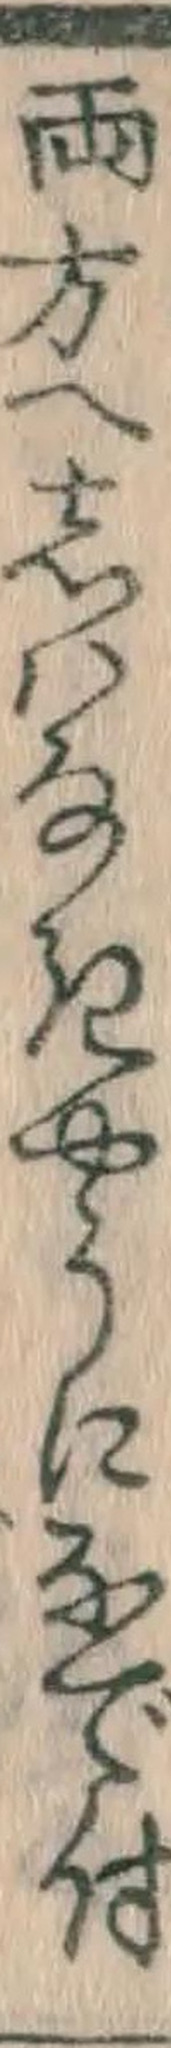両方へしはなきやうになで付
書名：広益秘事大全 3巻. [2]
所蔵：国立国会図書館 National Diet Library, JAPAN
